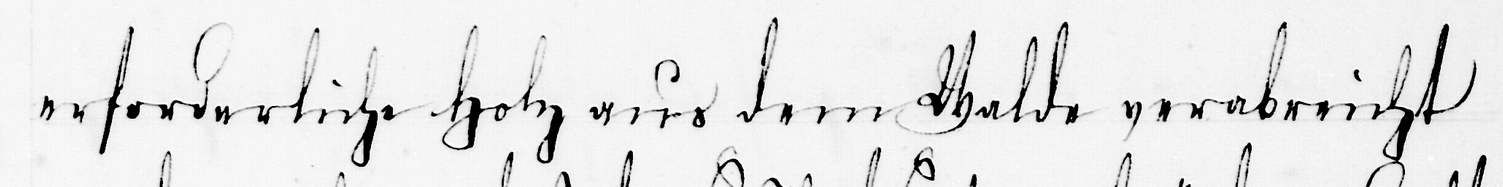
erforderliche Holz aus dem Walde verabreicht
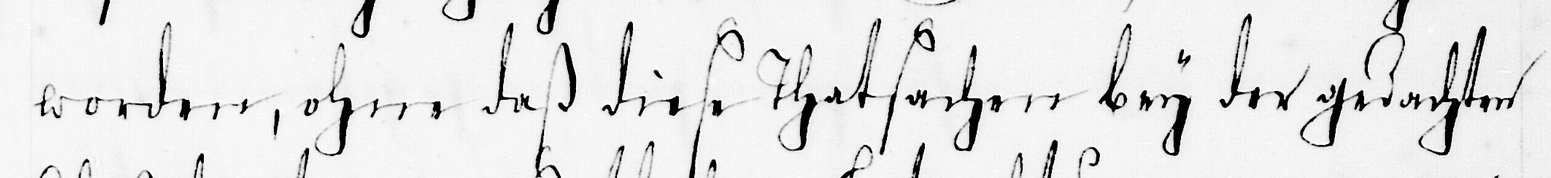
worden, ohne daß diese Thatsachen bey der gedachten
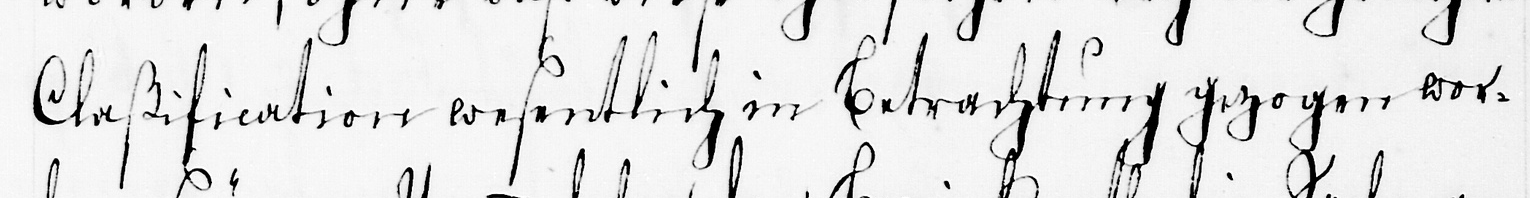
Claßification wesentlich in Betrachtung gezogen wor¬
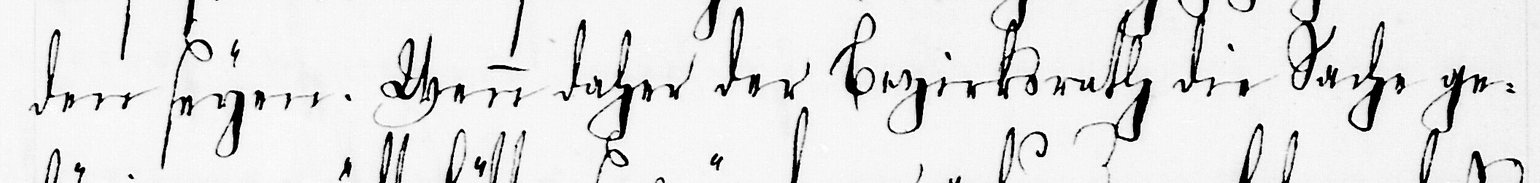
den seyen. Wenn daher der Bezirksrath die Sache ge¬
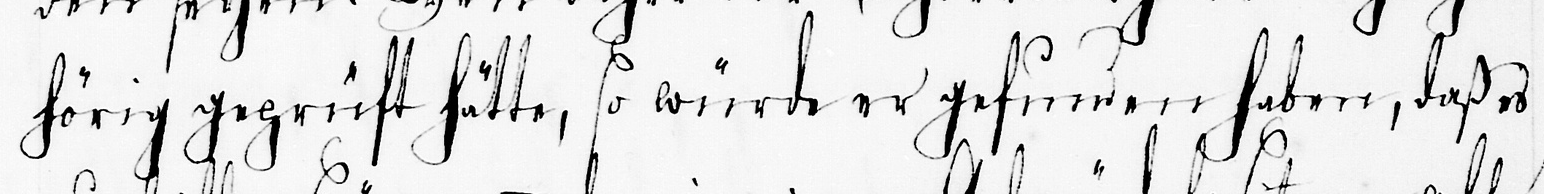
hörig geprüft hätte, so würde er gefunden haben, daß es
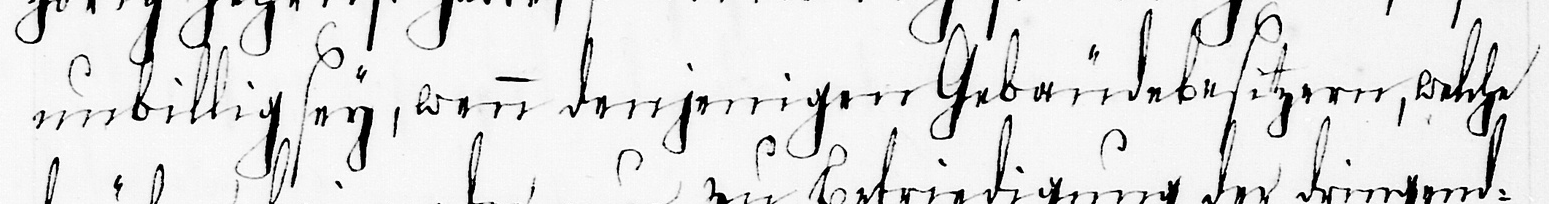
unbillig sey, wenn denjenigen Gebäudebesitzern, welche
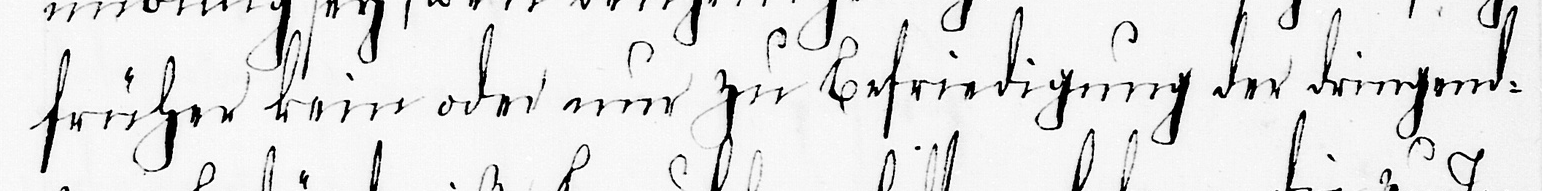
früher kein oder nur zu Befriedigung der dringend¬
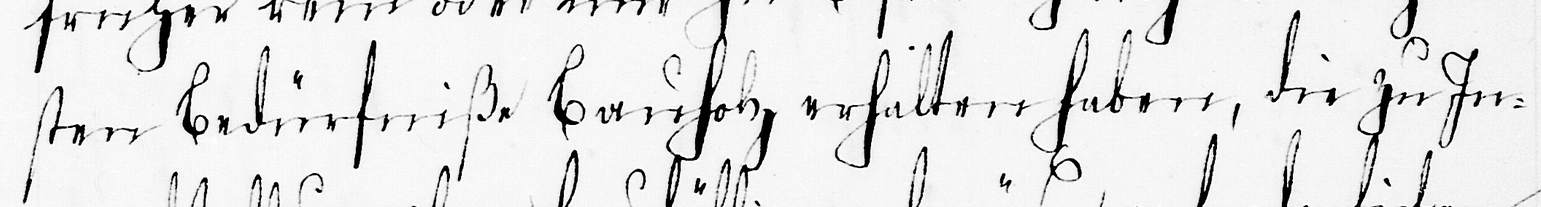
sten Bedürfniße Bauholz erhalten haben, die zu In¬
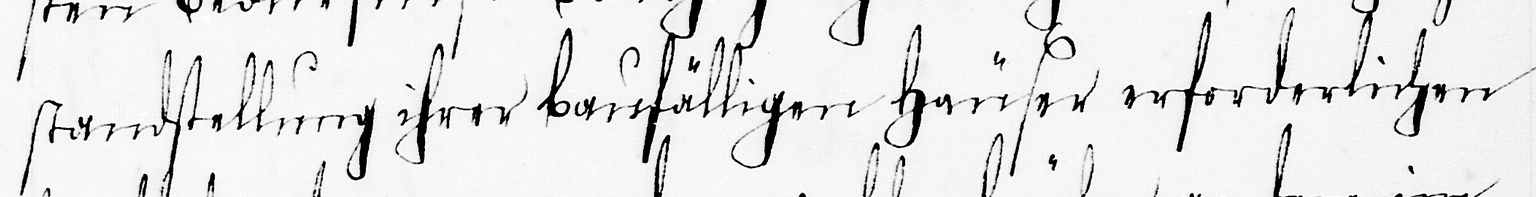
standstellung ihrer baufälligen Häuser erforderlichen
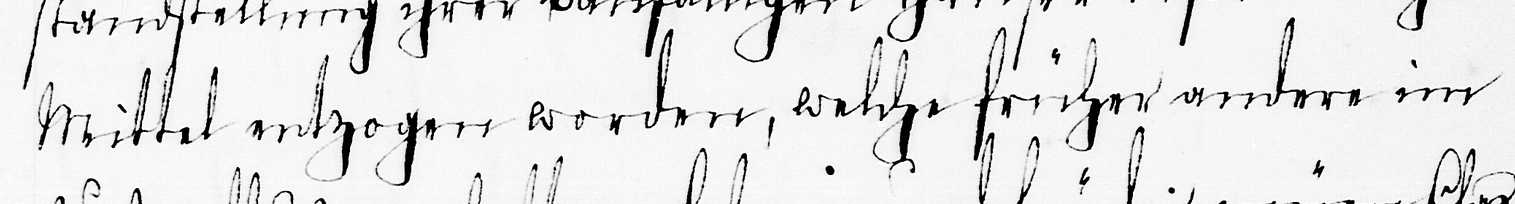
Mittel entzogen worden, welche früher andere im
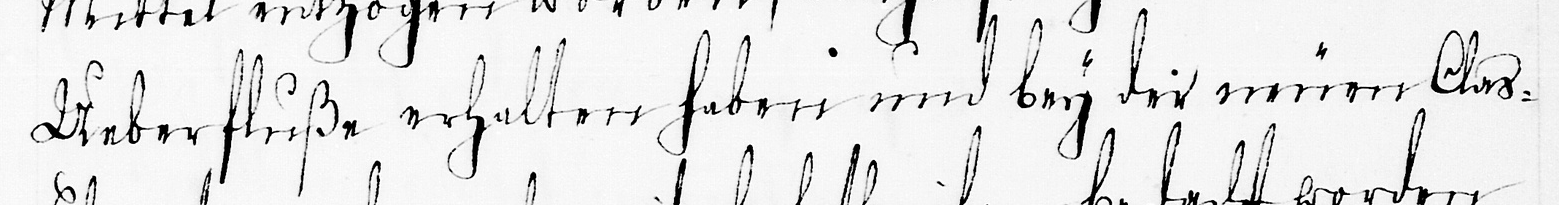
Ueberfluße erhalten haben und bey der neuen Claß¬
